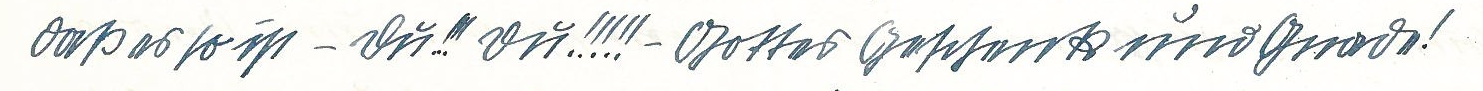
daß es so ist – Du!!! Du!!!!! – Gottes Geschenk und Gnade!
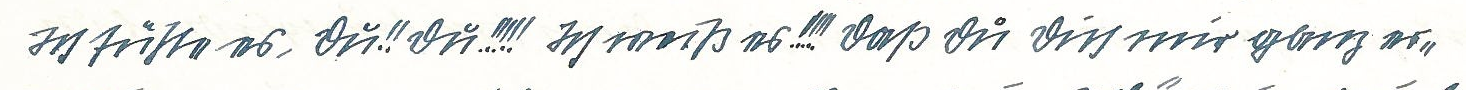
Ich fühle es, Du!! Du!!!!! Ich weiß es!!!!! Daß Du Dich mir ganz er¬
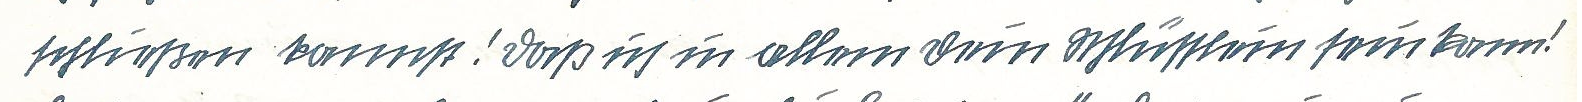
schließen kannst! Daß ich in allem Dein Schlüßlein sein kann!
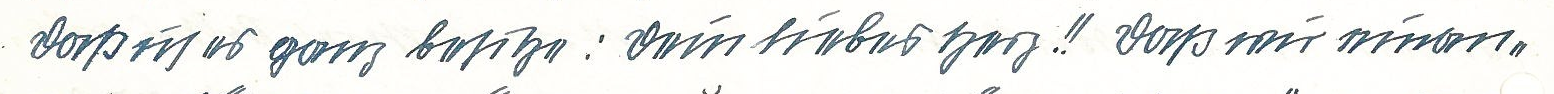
Daß ich es ganz besitze: Dein liebes Herz!! Daß wir einan¬
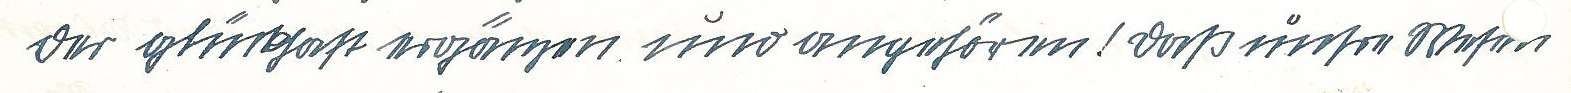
der glückhaft ergänzen und angehören! Daß unsre Wese
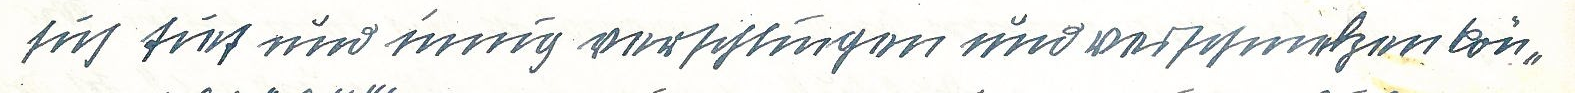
sich tief und innig verschlingen und verschmelzen kön¬
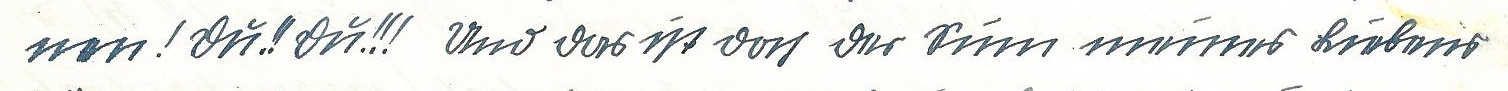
nen! Du!! Du!!! Und das ist doch der Sinn meines Liebens
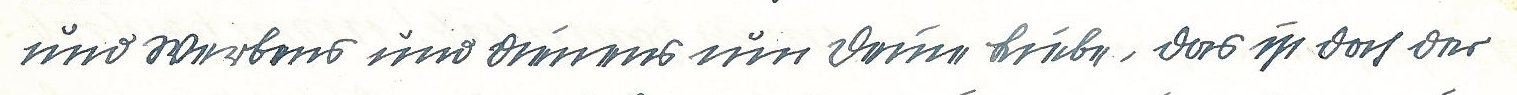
und Werbens und Dienens um Deine Liebe, das ist doch der
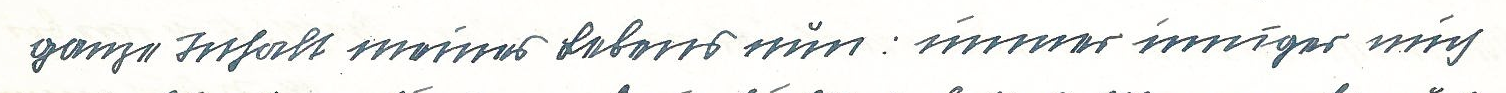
ganze Inhalt meines Lebens nun: immer inniger mich
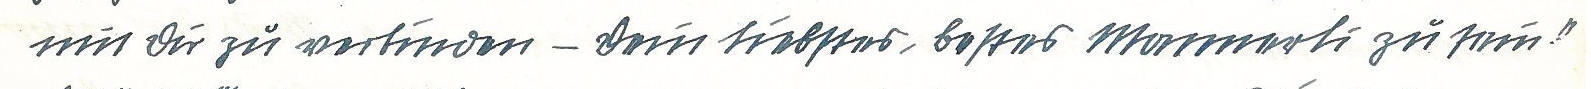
mit Dir zu verbinden – Dein liebstes, bestes Mannerli zu sein!! Du!!
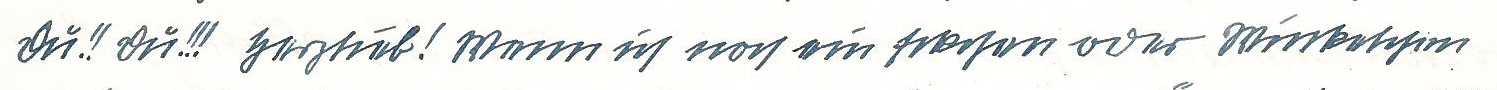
Du!!! Herzlieb! Wenn ich noch ein Eckchen oder Winkelchen
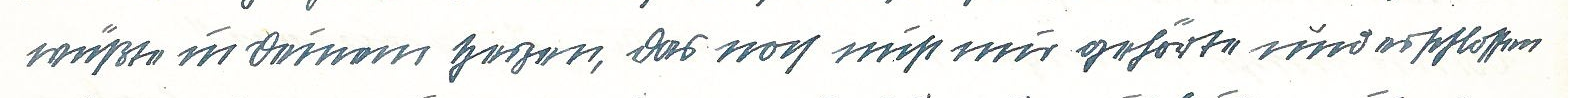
wüßte in Deinem Herzen, das noch nicht mir gehörte und erschlossen
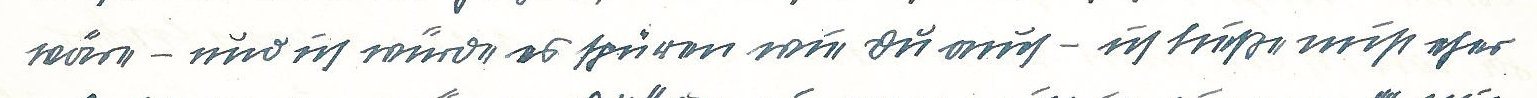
wäre – und ich würde es spüren wie Du auch – ich ließe nicht eher
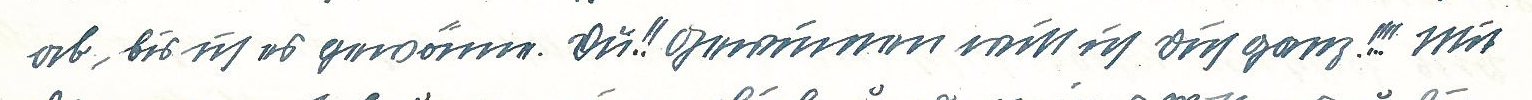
ab, bis ich es gewönne. Du!! Gewinnen will ich Dich ganz!!!!! Mit
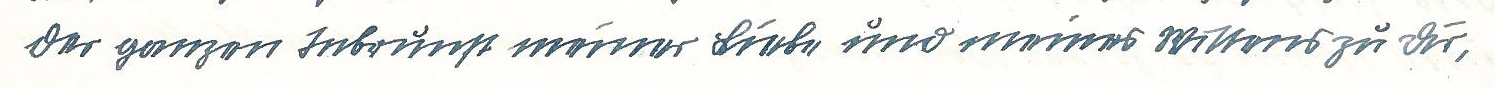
der ganzen Inbrunst meiner Liebe und meines Willens zu Dir,
